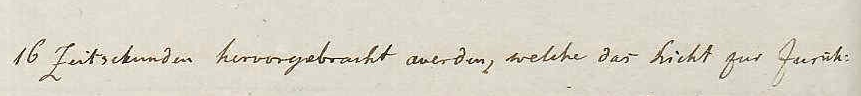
16 Zeitsekunden hervorgebracht werden, welche das Licht zur Zurük-
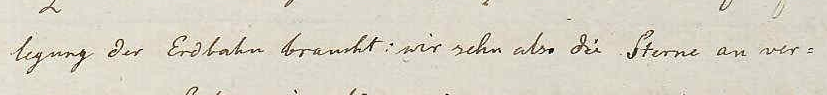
legung der Erdbahn braucht: wir sehn also die Sterne an ver-
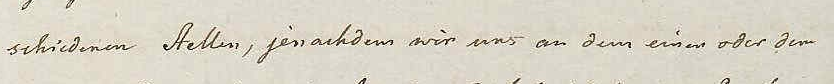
schiedenen Stellen, jenachdem wir uns an dem einen oder dem
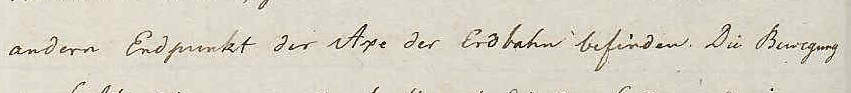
andern Endpunkt der Axe der Erdbahn befinden. Die Bewegung
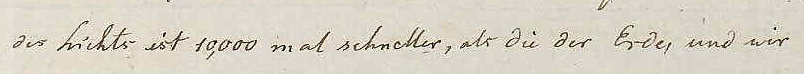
des Lichts ist 10,000 mal schneller, als die der Erde, und wir
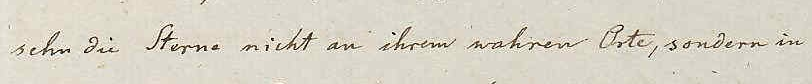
sehn die Sterne nicht an ihrem wahren Orte, sondern in
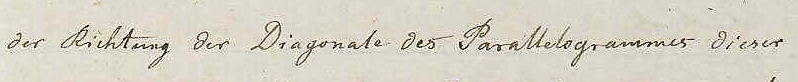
der Richtung der Diagonale des Parallelogrammes dieser
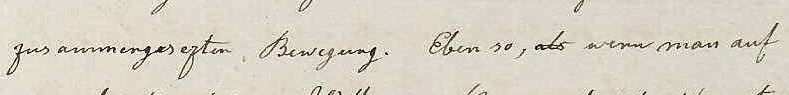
zusammengesezten Bewegung. Eben so, als wenn man auf
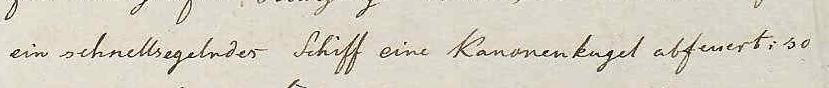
ein schnellsegelndes Schiff eine Kanonenkugel abfeuert: so
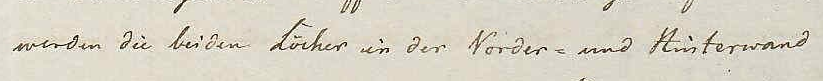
werden die beiden Löcher in der Vorder- und Hinterwand
